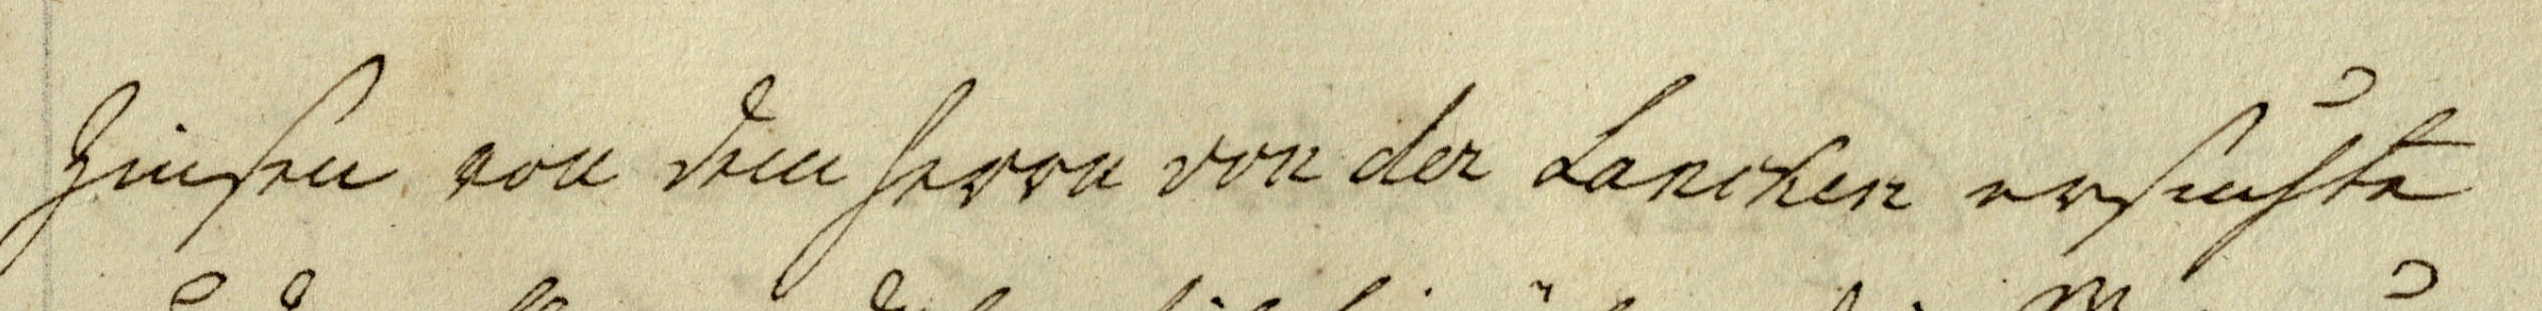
Zinsen von dem Herrn von der Lancken ersuchte
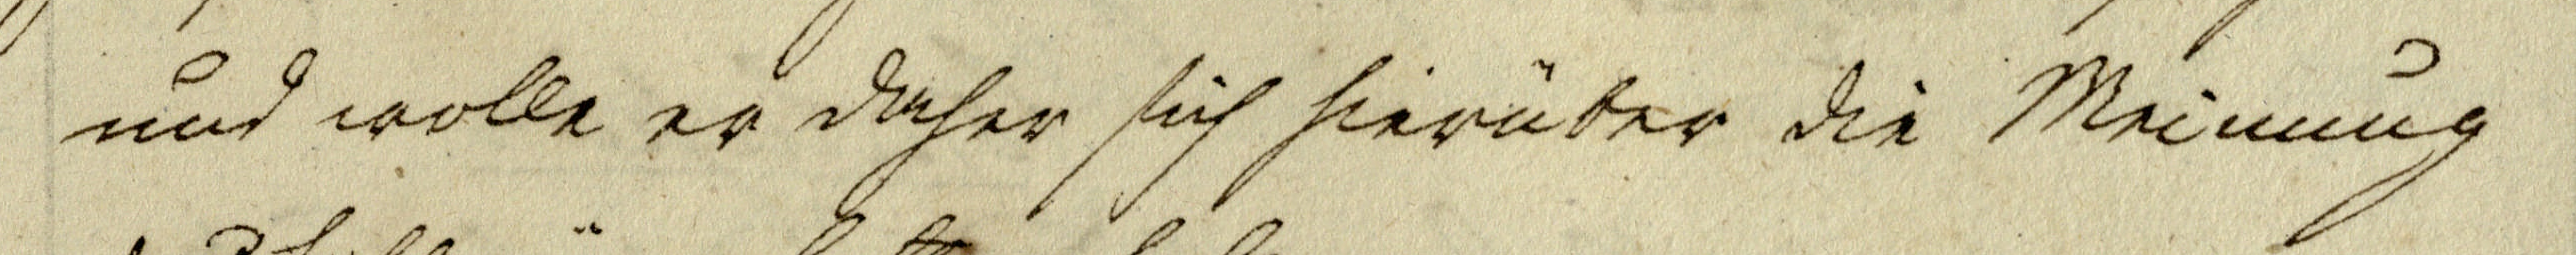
und wolle er daher sich hierüber die Meinung
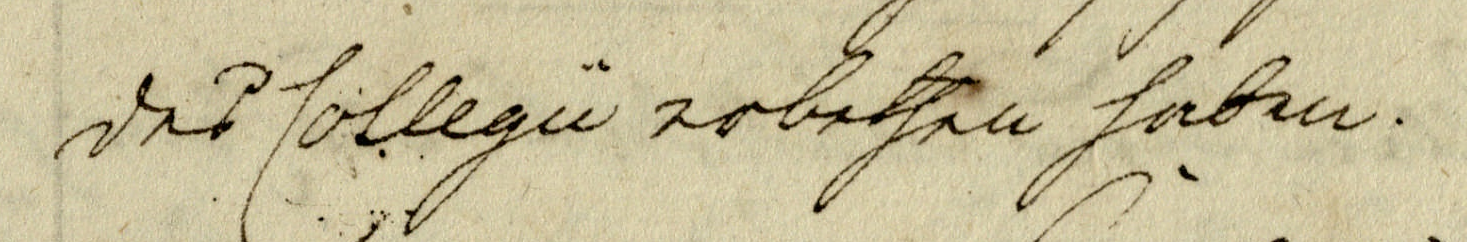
des Collegii erbethen haben.
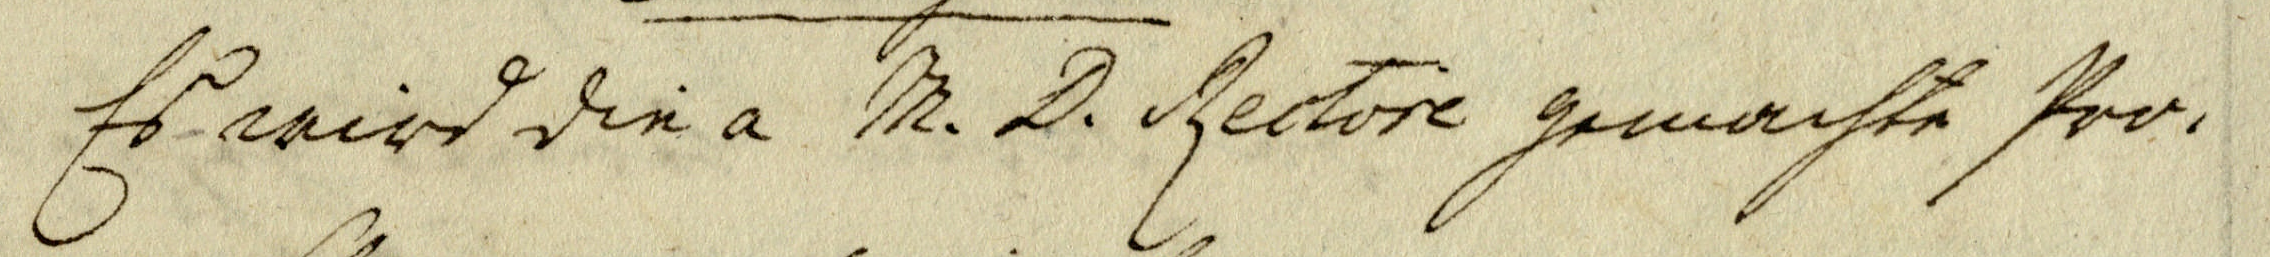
Es wird die a M. D. Rectore gemachte Prof¬
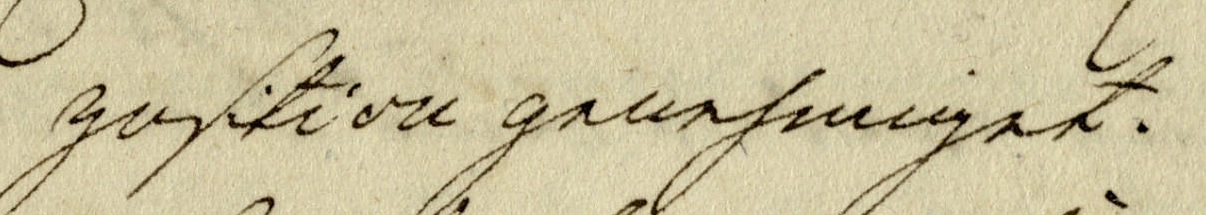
position genehmiget.
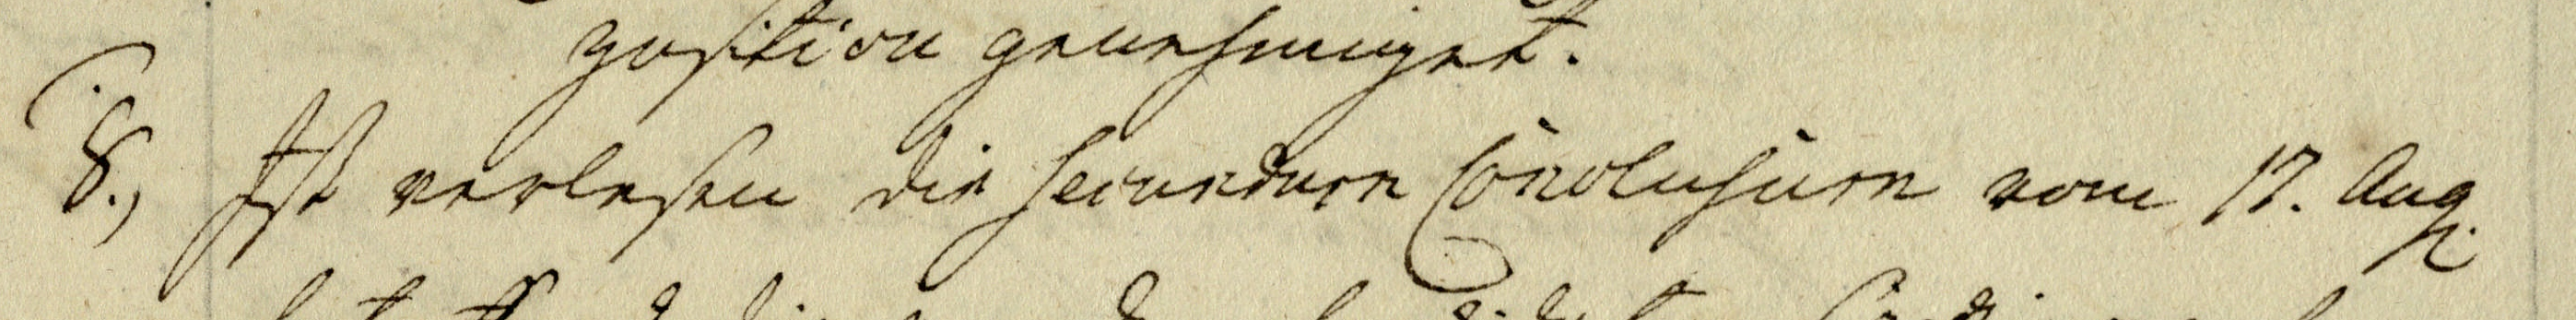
8., Ist verlesen die secundum Conclusum vom 17. Aug.
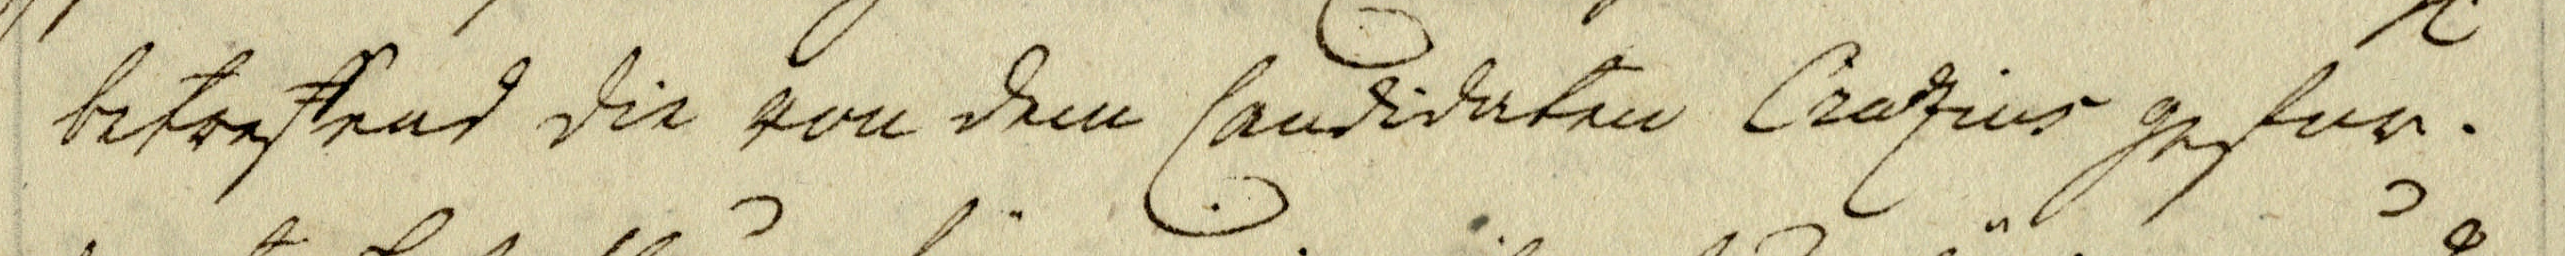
betreffend die von dem Candidaten Crazius gefor¬
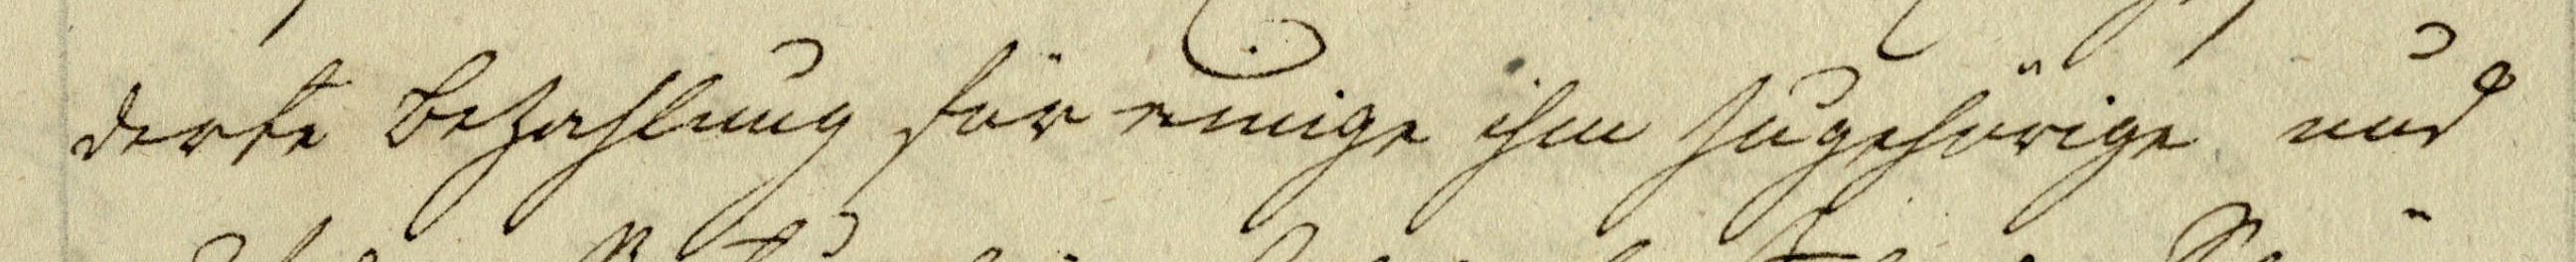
derte Bezahlung für einige ihm zugehörige und
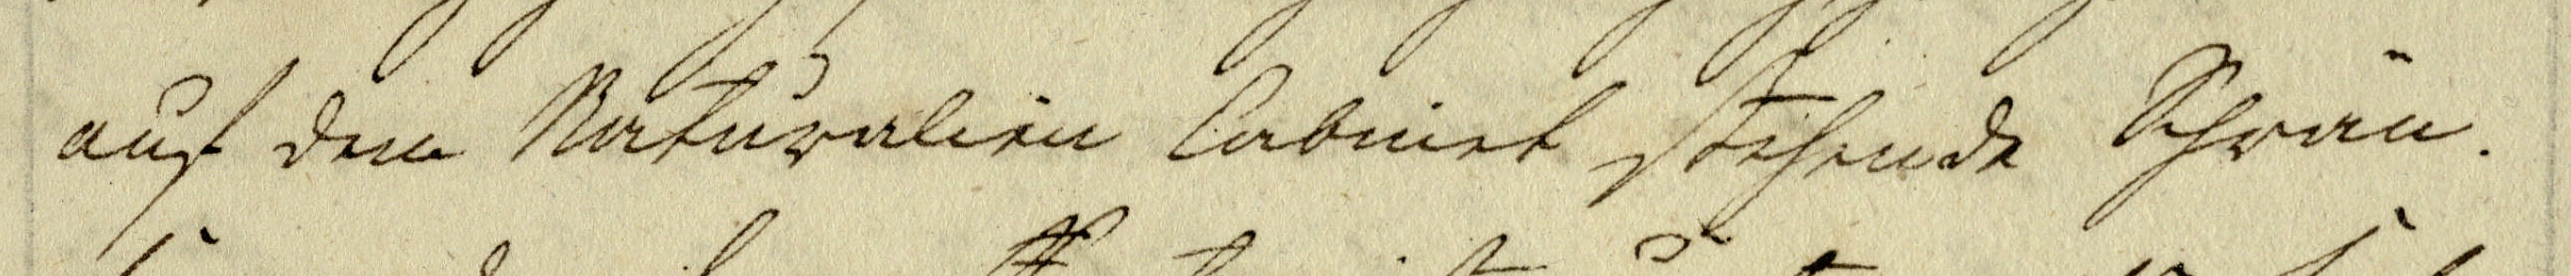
auf dem Naturalien Cabinet stehende Schrän¬
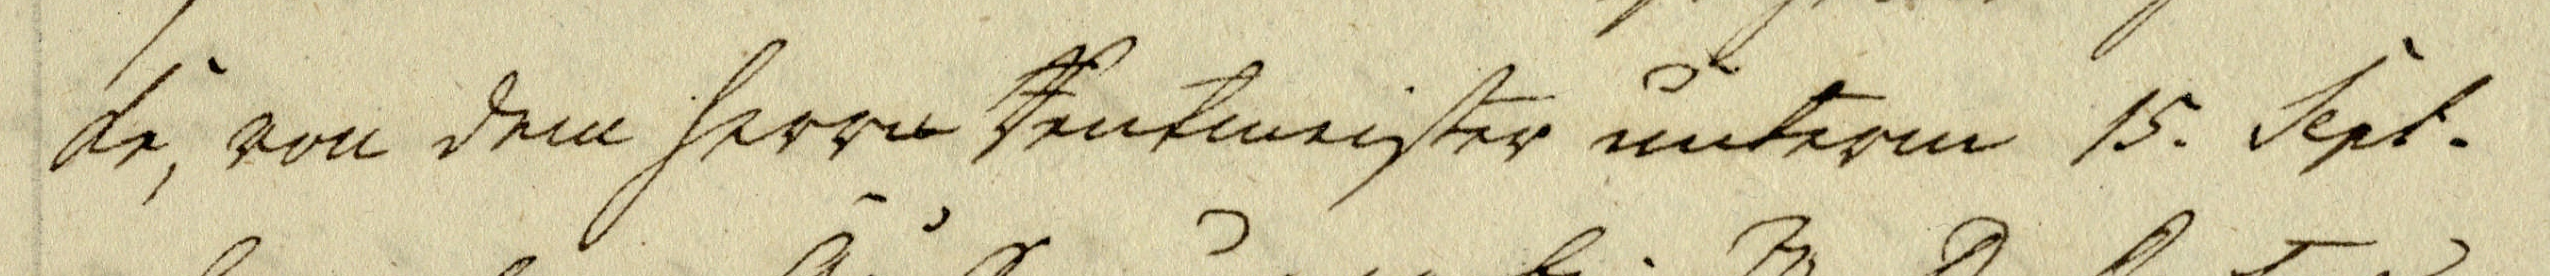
ke, von dem Herrn Rentmeister unterm 15. Sept.
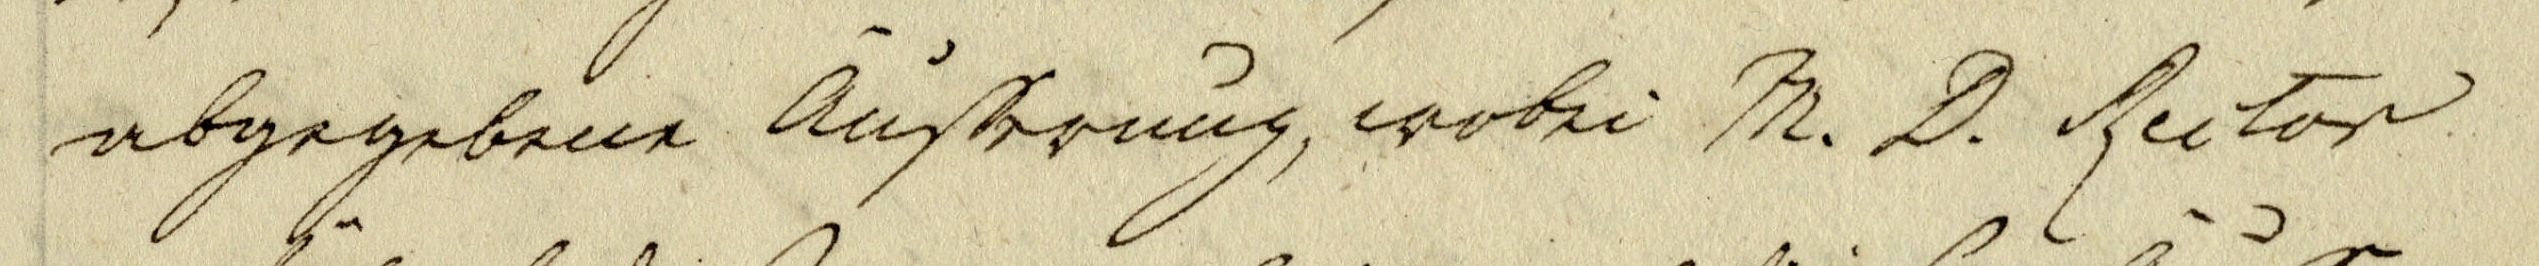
abgegebene Äusserung, wobei M. D. Rector
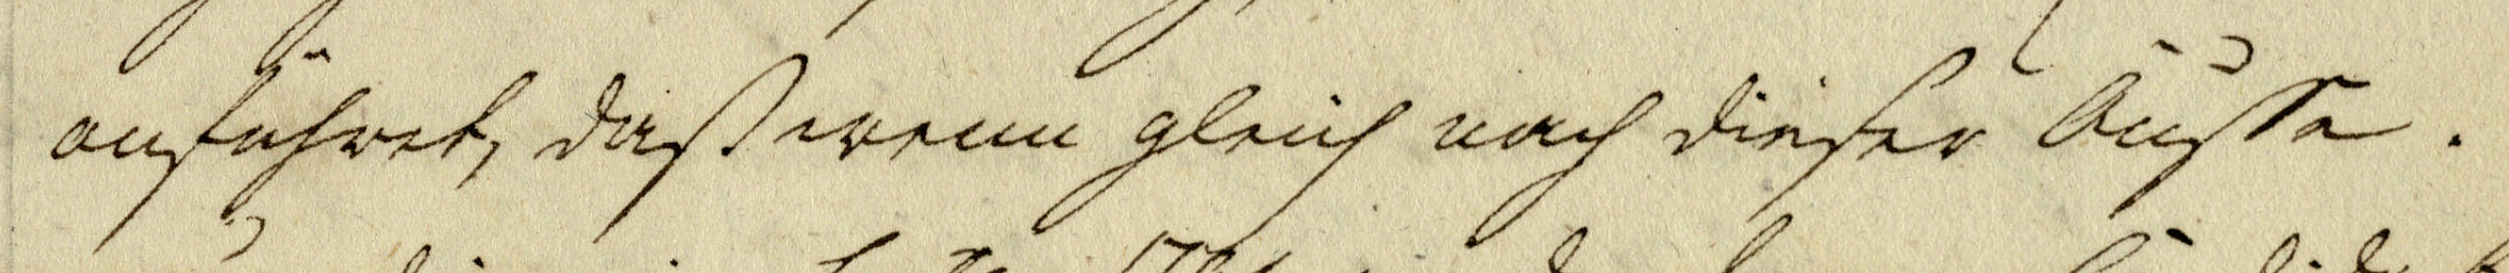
anführet, daß wenn gleich nach dieser Äusse¬
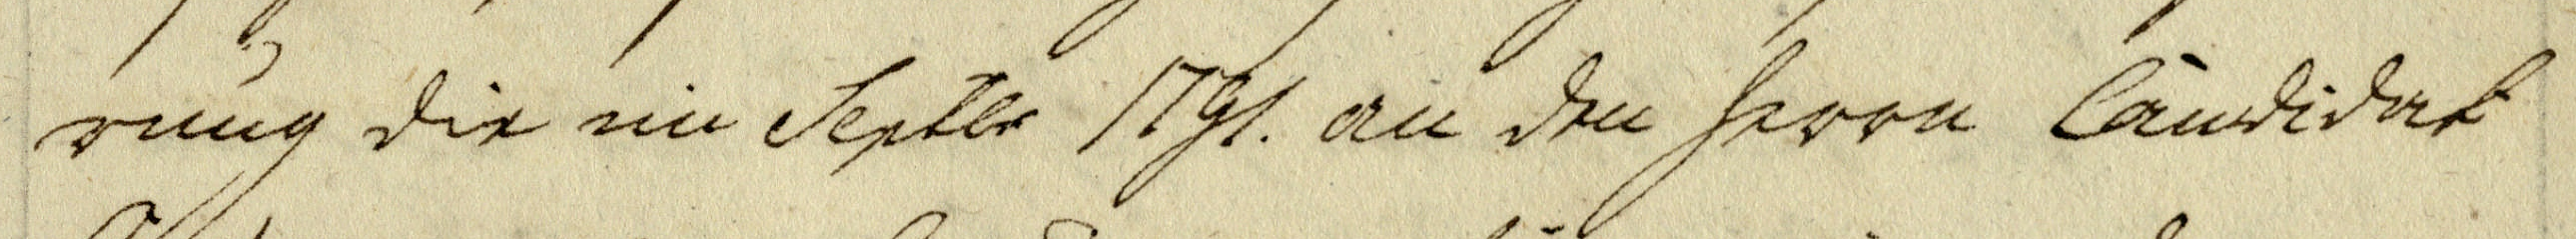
rung die im Septbr 1791. an den Herrn Candidat
